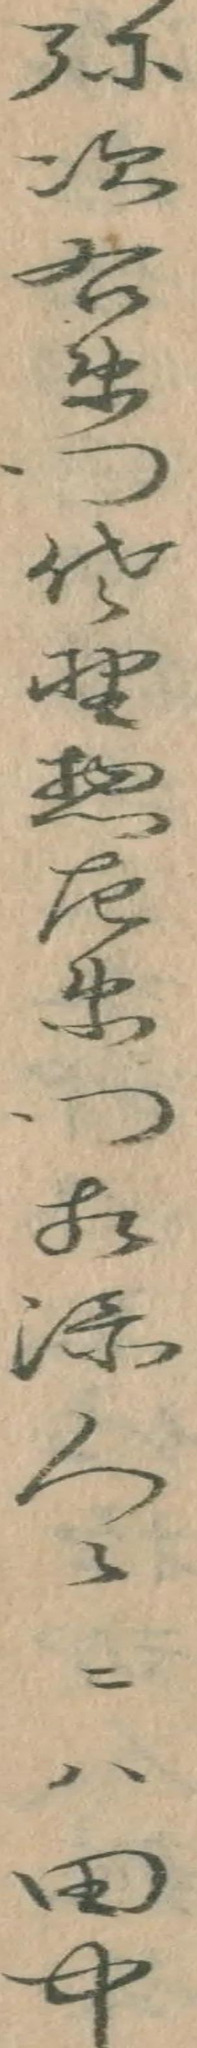弥次右衛門佐野惣左衛門相添人々には田中
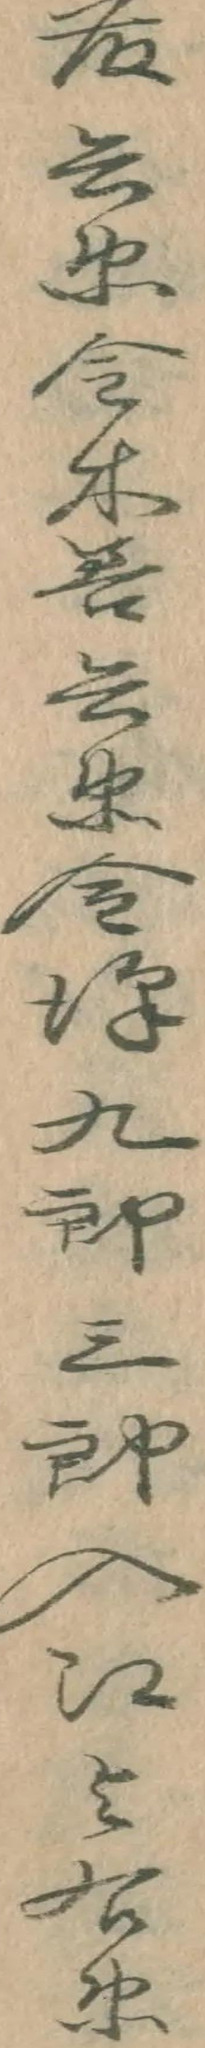藤兵衛金木善兵衛会津九郎三郎入江与右衛

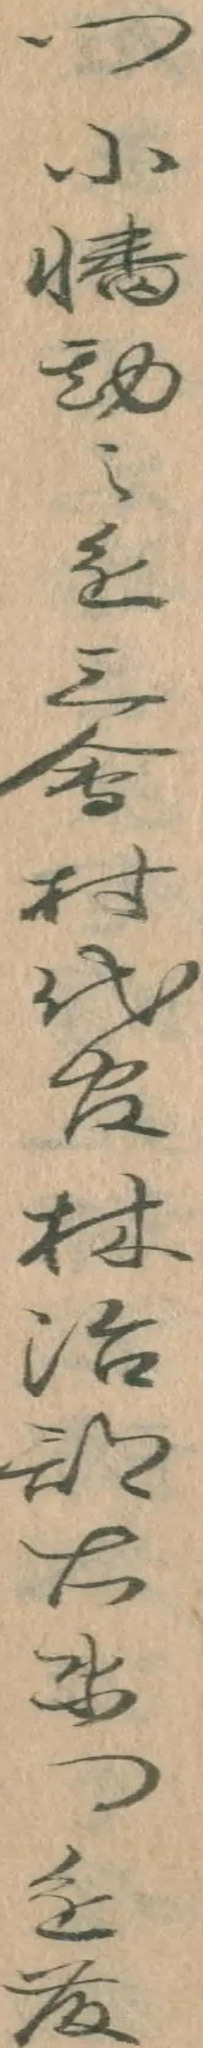門小幡勘之進三会村代官林治部右衛門進藤
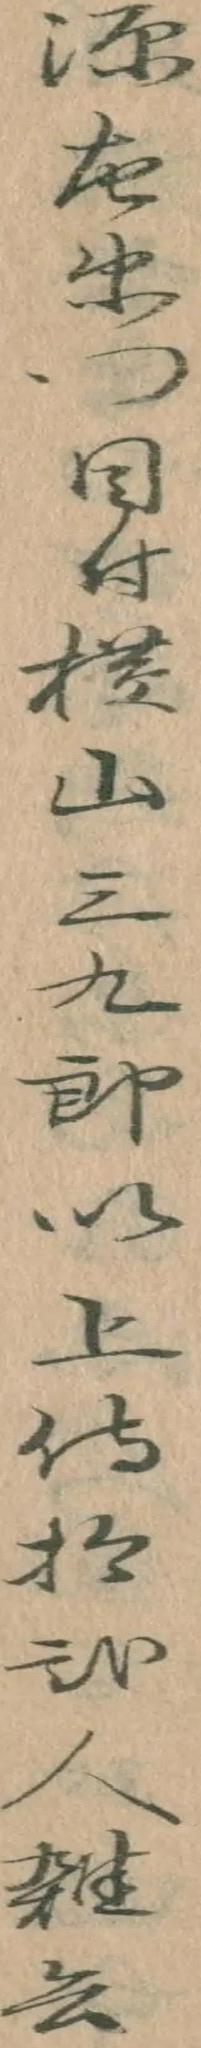源左衛門目付横山三九郎以上侍拾弐人雑兵
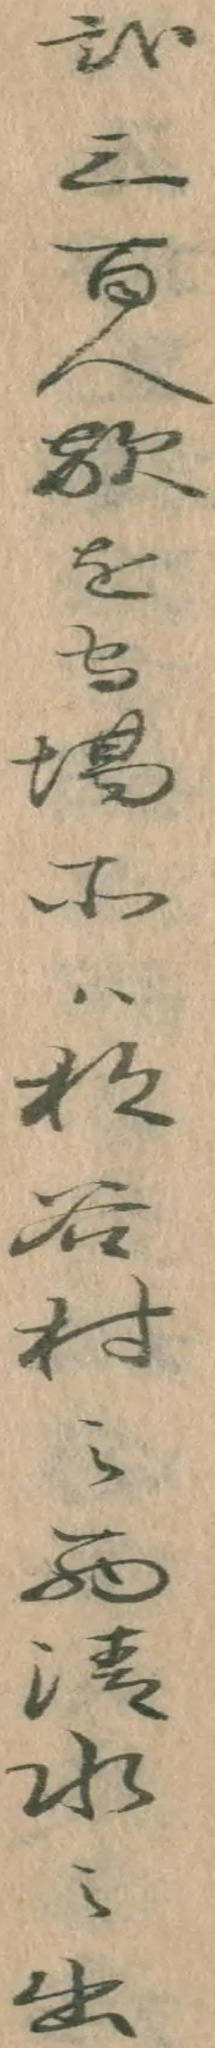弐三百人敵を守場所は杉谷村之西清水之出
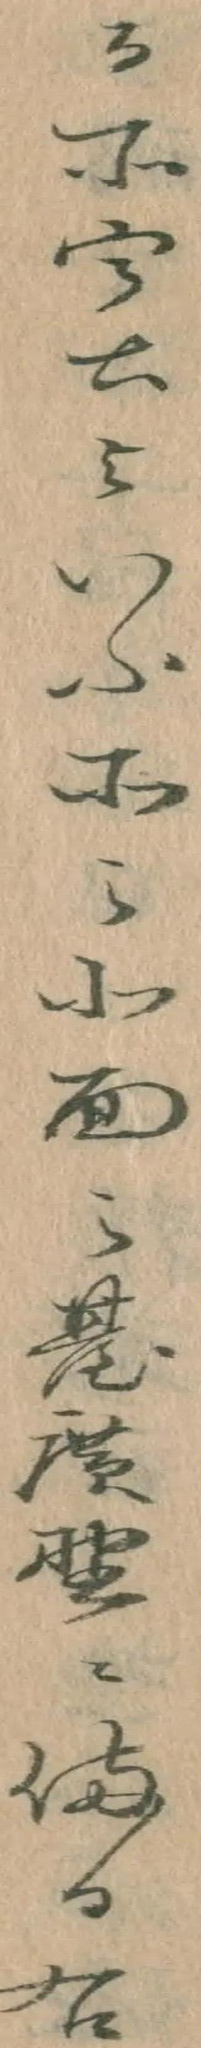る所宇土与いふ所之北面之台広野に備る右
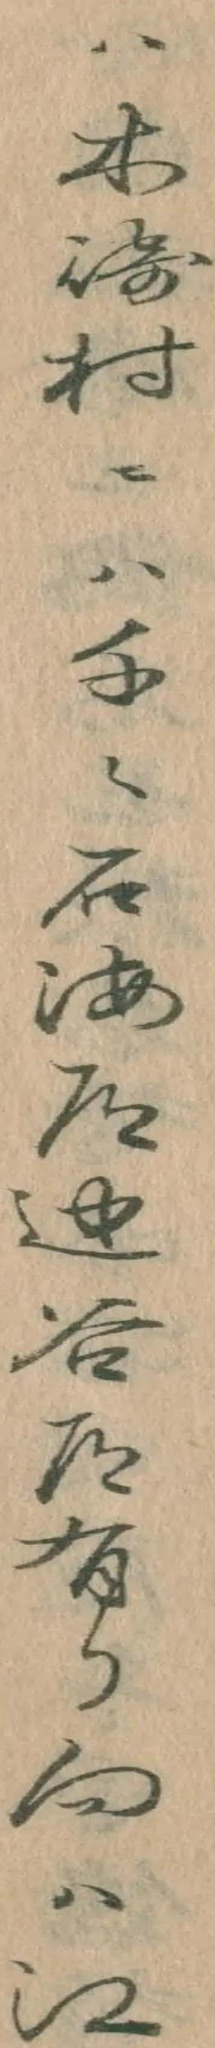は木崎村には千之石海道迚谷道有り向は江
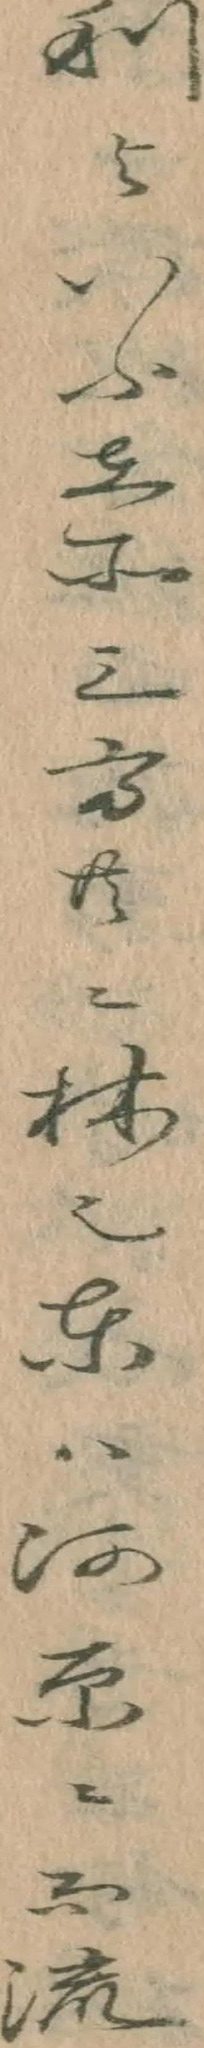利与いふ在所三方共に林也東は河原に而流
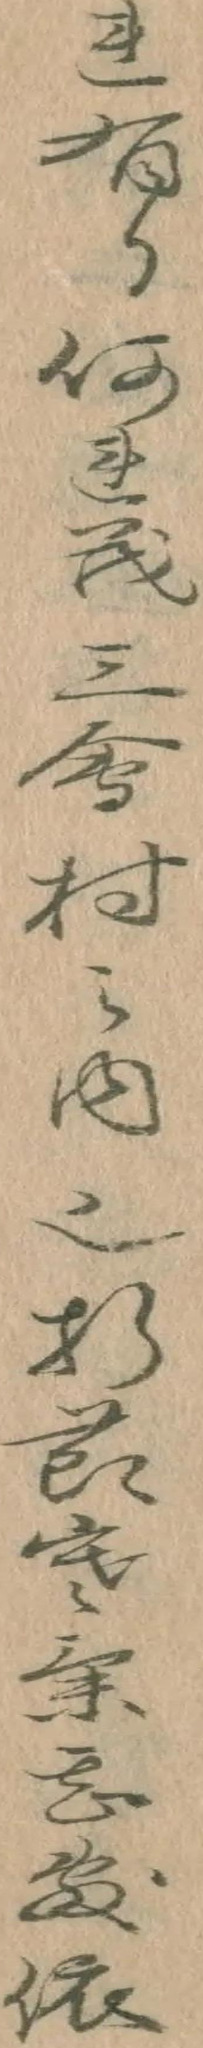連有り何連茂三会村之内也折節寒気甚敷依
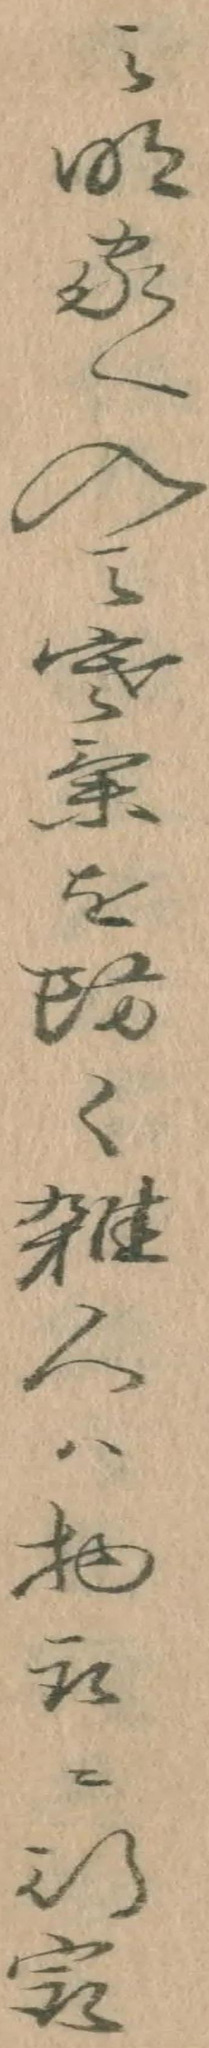之明家へ入之寒気を防く雑人は物取に行最
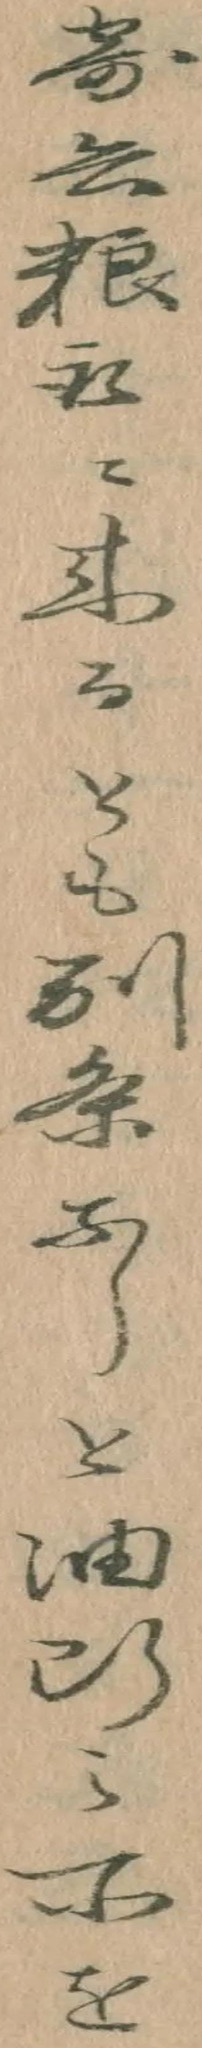寄兵粮取に成るとも別条なしと油断之所を
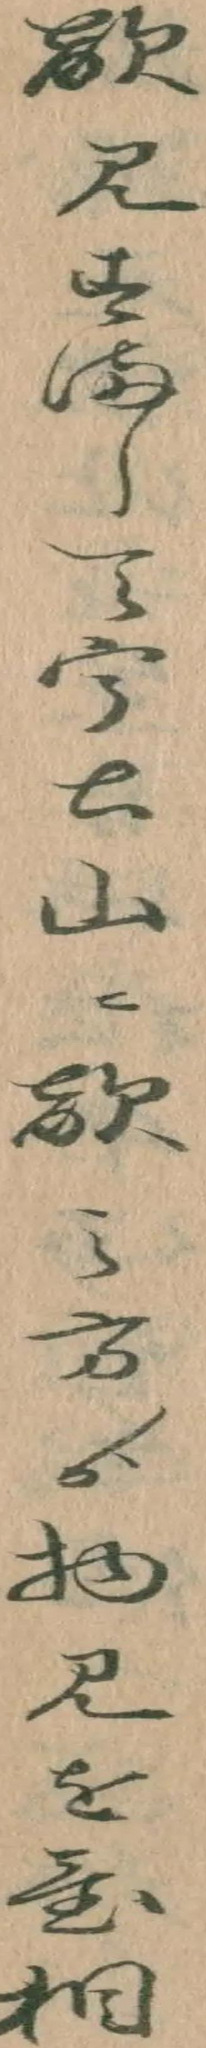敵見春満して宇土山に敵之方ゟ物見を置相
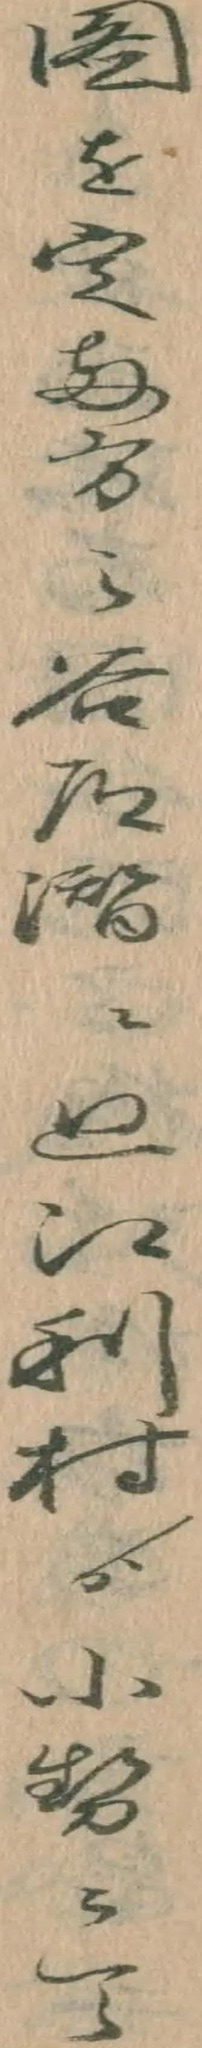図を定両方之谷道潜に廻江利村ゟ小勢にて
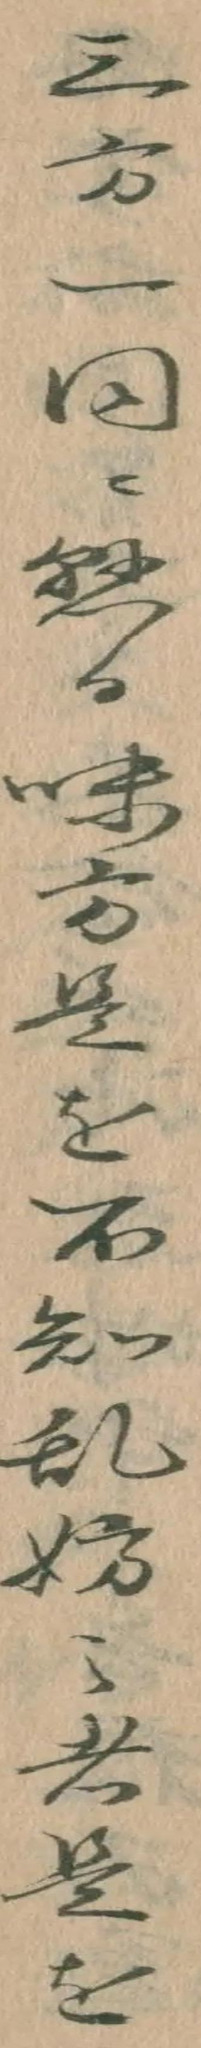三方一同に懸る味方是を不知乱妨之者是を
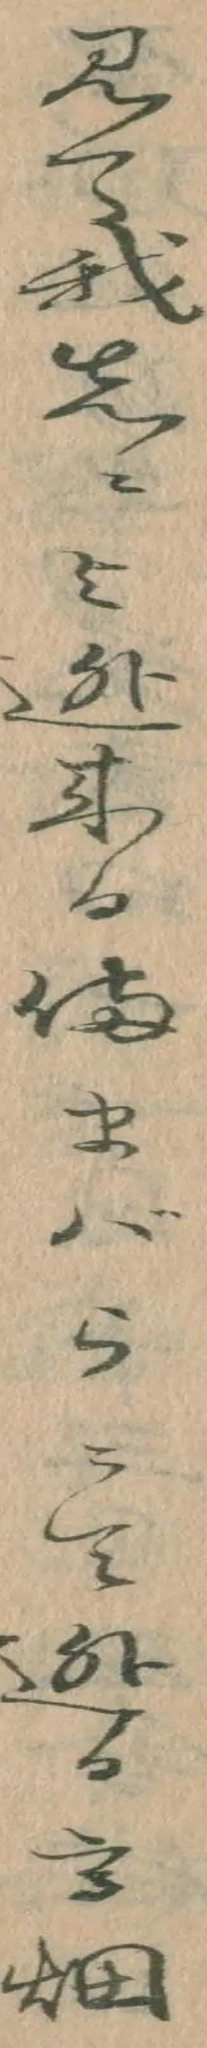見て我先に与逃来る備まばらにて逃る高畑
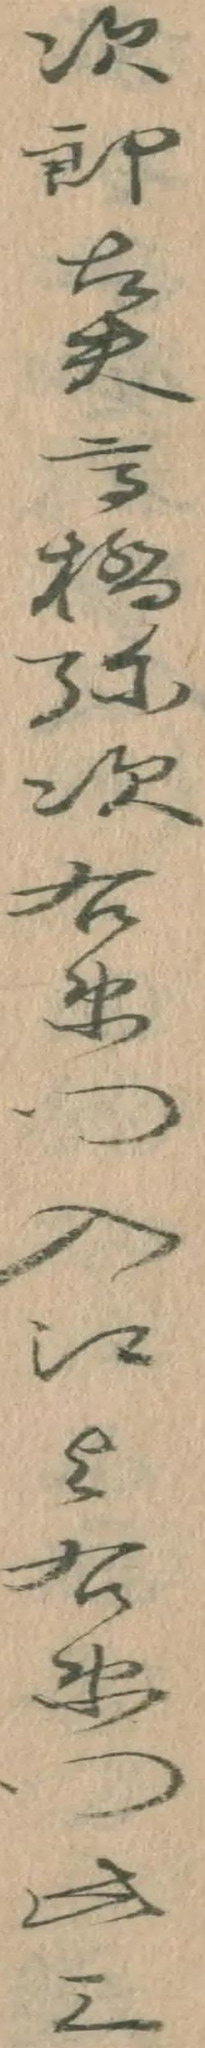次郎太夫高橋弥次右衛門入江与右衛門此三
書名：切支丹御退治記 49巻. [2]
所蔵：国立国会図書館 National Diet Library, JAPAN
